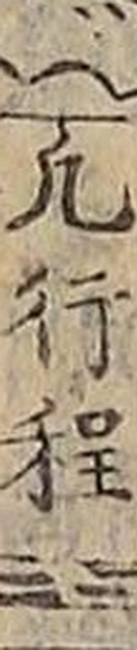凡行程
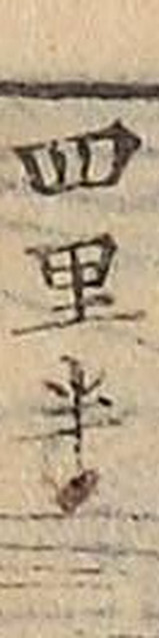四里半
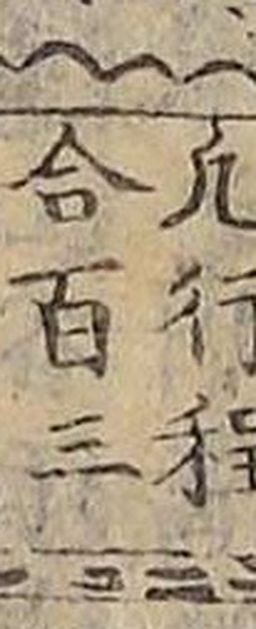合百三
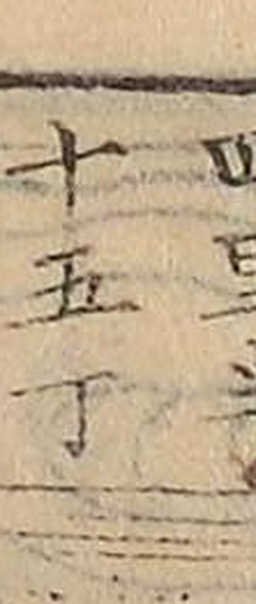十五丁
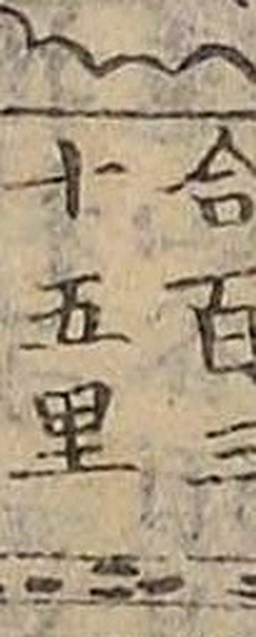十五里
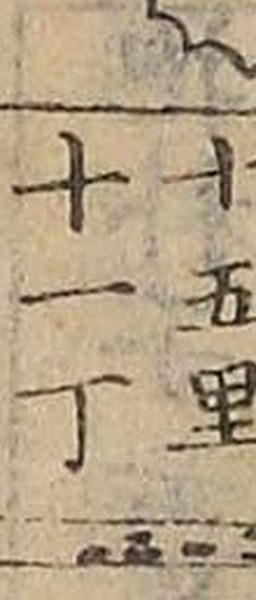十一丁

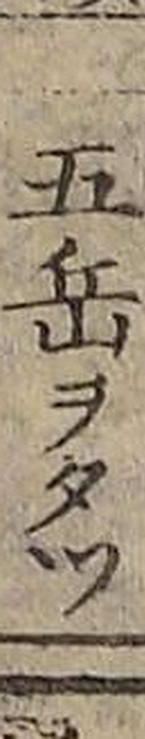五岳ヲタツ
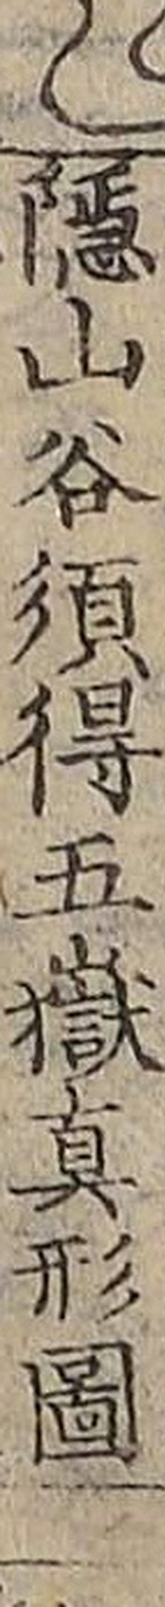隠山谷須得五岳真形図
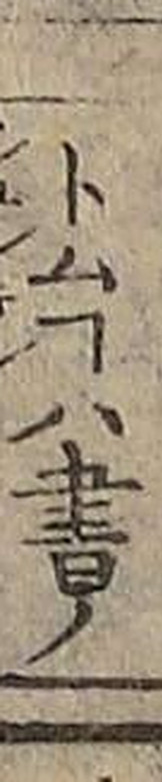トムヿハ書ノ
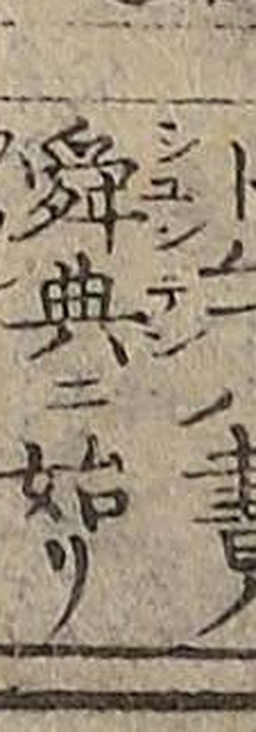舜典ニ始リ
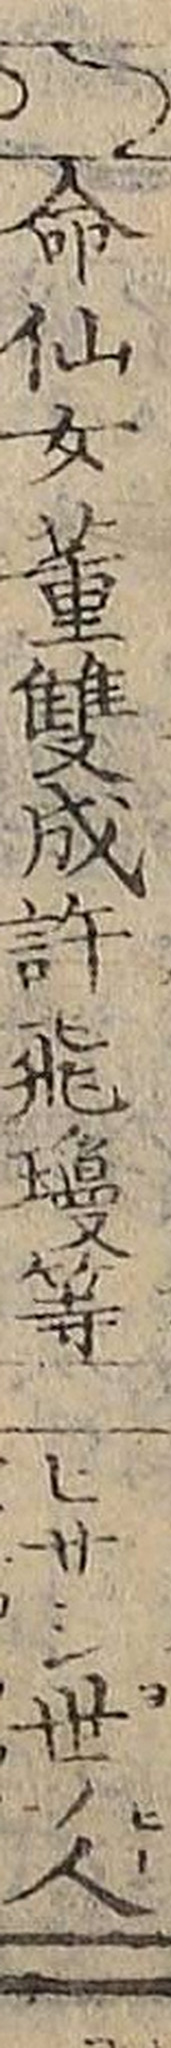命仙女董双成許飛㻴等
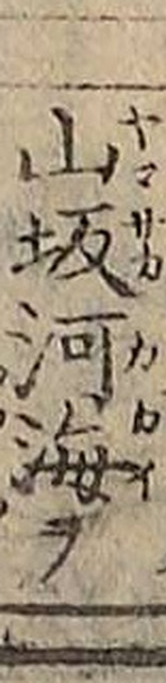山坂河海ヲ
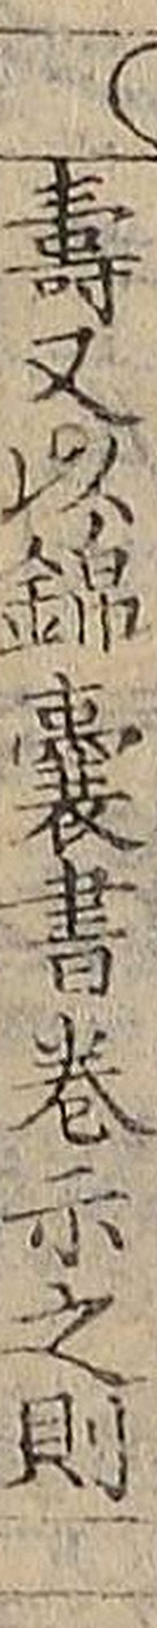寿又以錦嚢書巻示之則
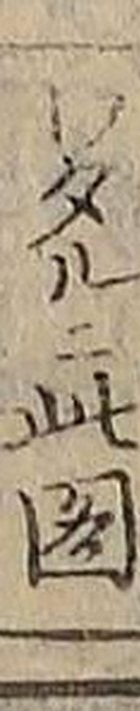ワ夕ルニ此図
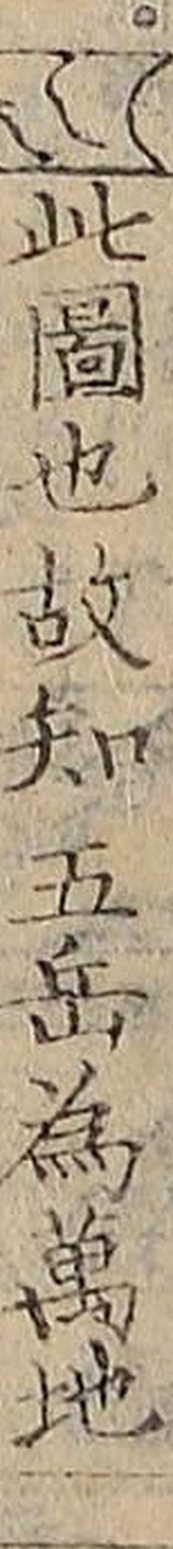此図也故知五岳為万地
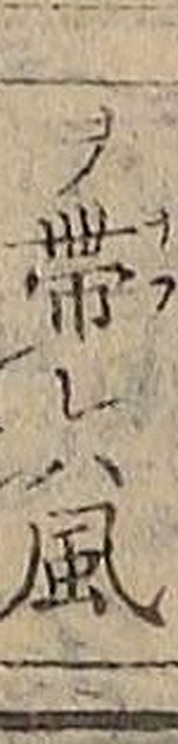ヲ帯レハ風
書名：旅行用心集
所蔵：神戸大学附属図書館 国文学研究資料館
